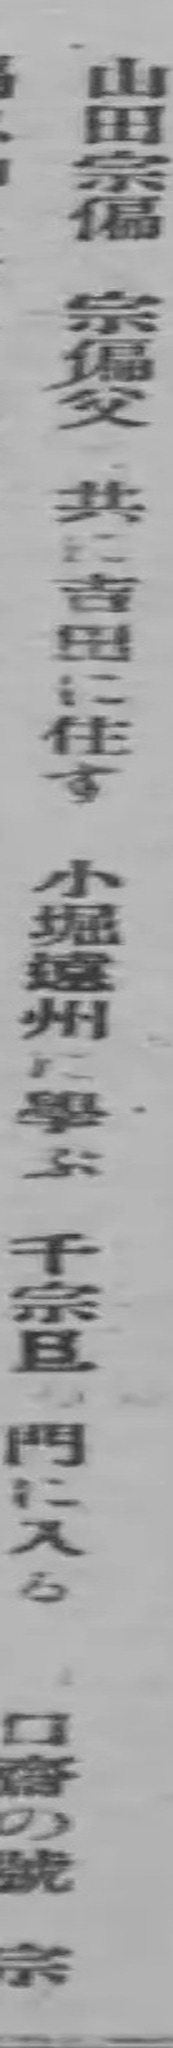山田宗偏宗偏父共に吉田に住す小堀遠州に学ぶ千宗旦の門に入る口斉の号宗
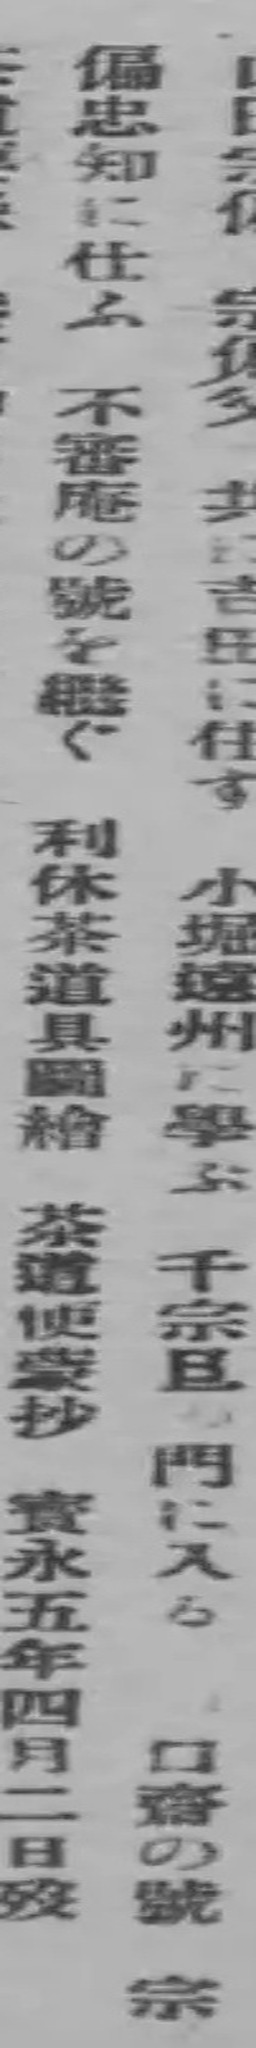偏忠知に仕ふ不審庵の号を継ぐ利休茶道具図絵茶道便蒙抄宝永五年四月二日歿
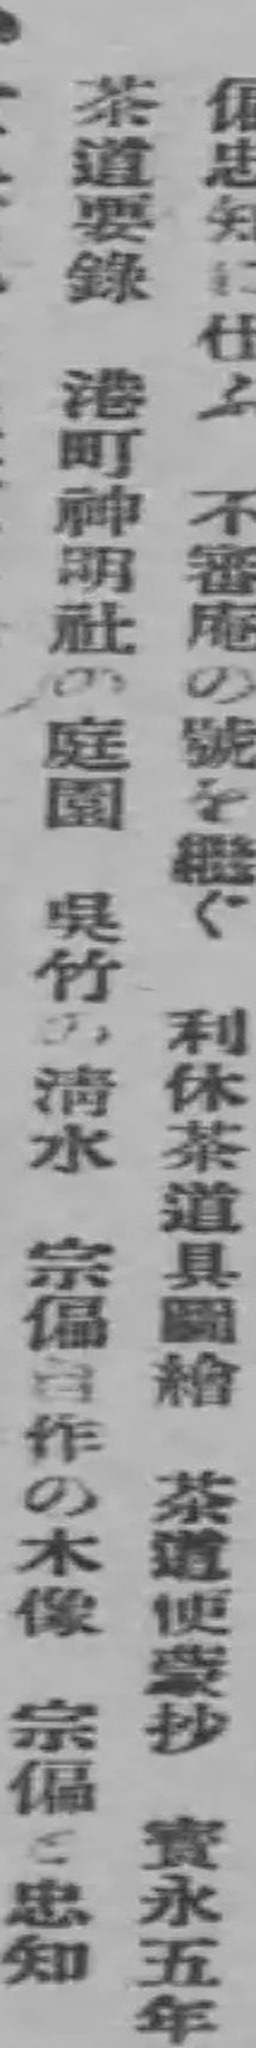茶道要録港町神明社の庭園呉竹の清水宗偏自作の木像宗偏と忠知
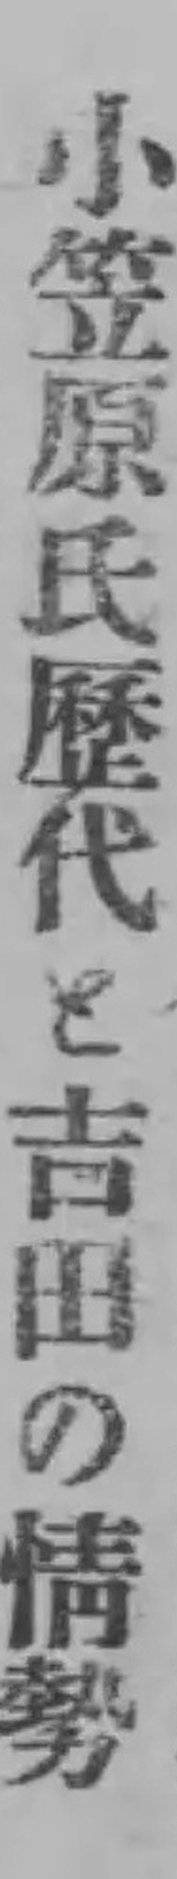小笠原氏歴代と吉田の情勢
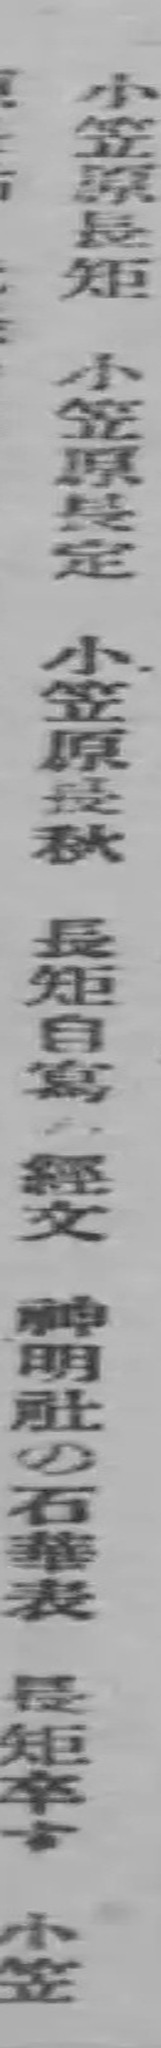小笠原長矩小笠原長定小笠原長秋長矩自写の経文神明社の石華表長矩卒す小笠
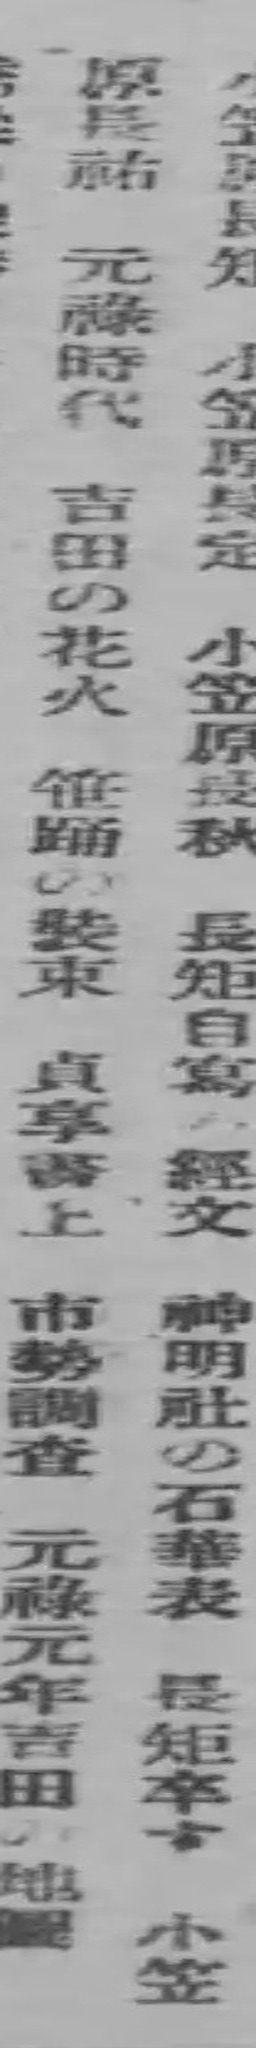原長祐元禄時代吉田の花火笹踊の装束貞享書上市勢調査元禄元年吉田の地図
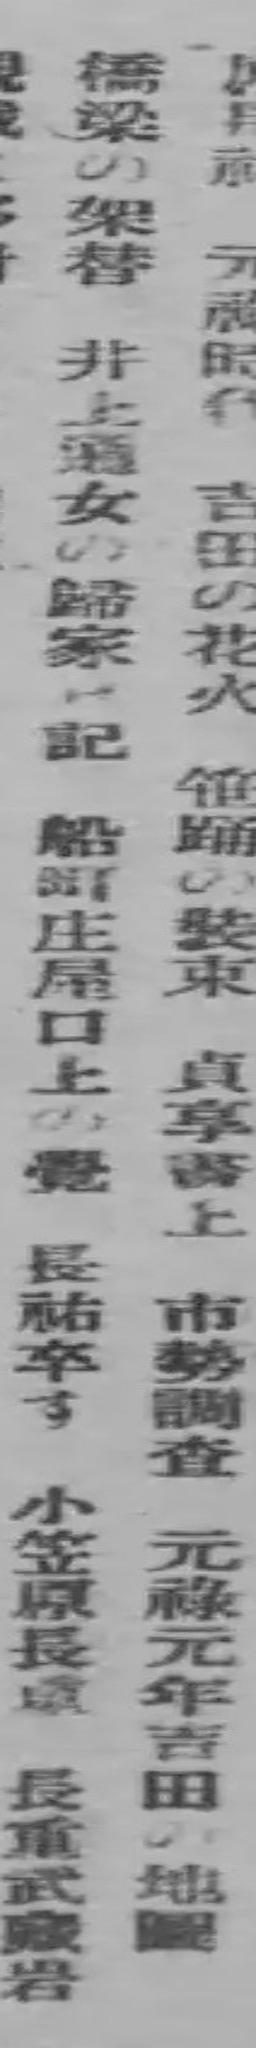橋梁の架替井上通女の帰家日記船町庄屋口上の覚長祐卒す小笠原長重長重武蔵岩
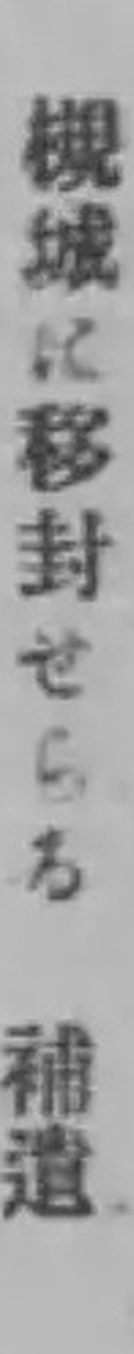槻城に移封せらる補遺
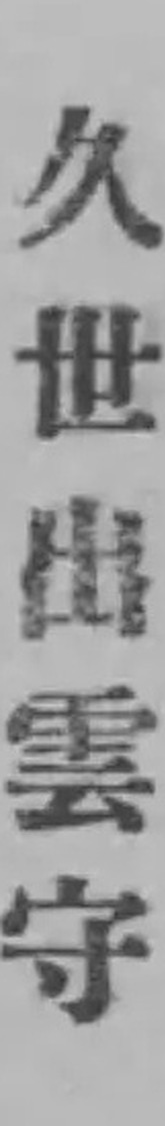久世出雲守
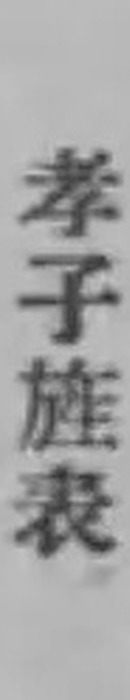孝子旌表
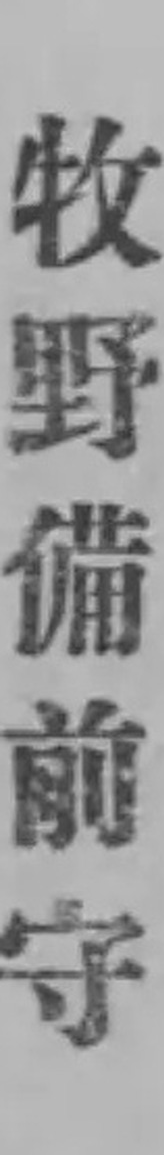牧野備前守
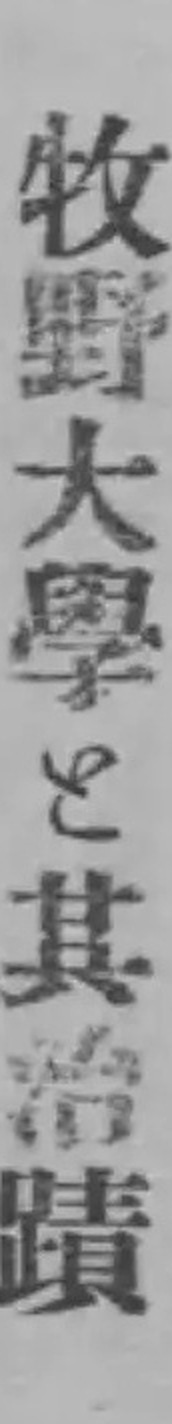牧野大学と其治蹟
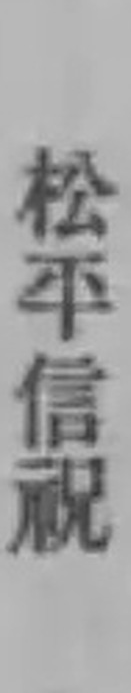松本信祝
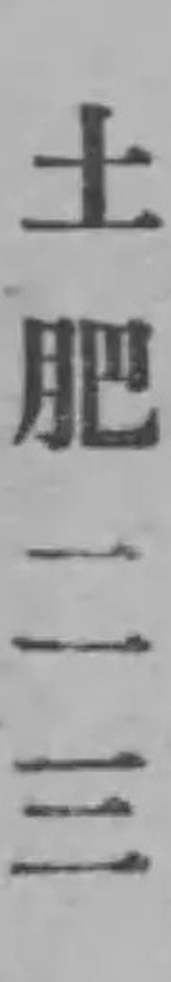土肥二三
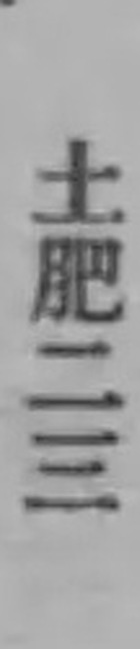土肥二三
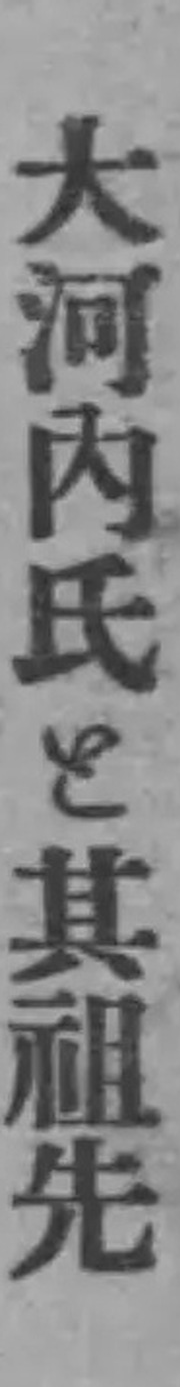大河内氏と其祖先
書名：豊橋市史談
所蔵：国立国会図書館 National Diet Library, JAPAN
